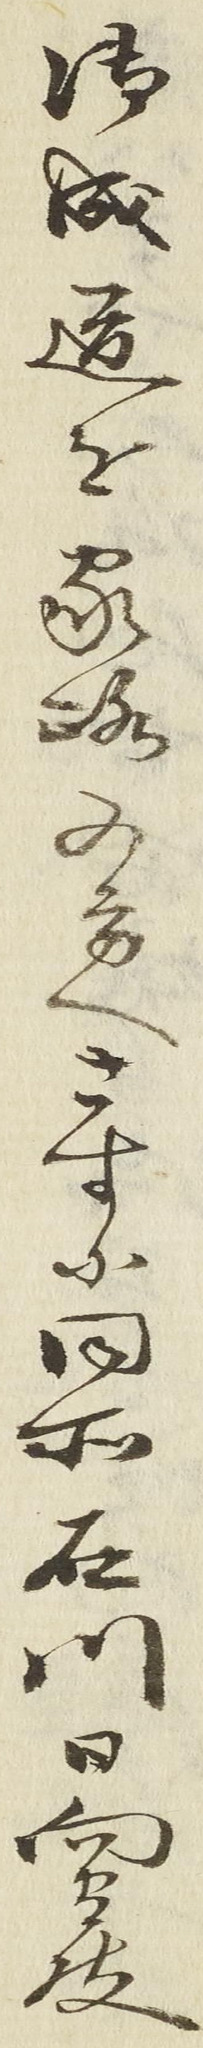御成道を家路の方へさすに同所石川日向守殿
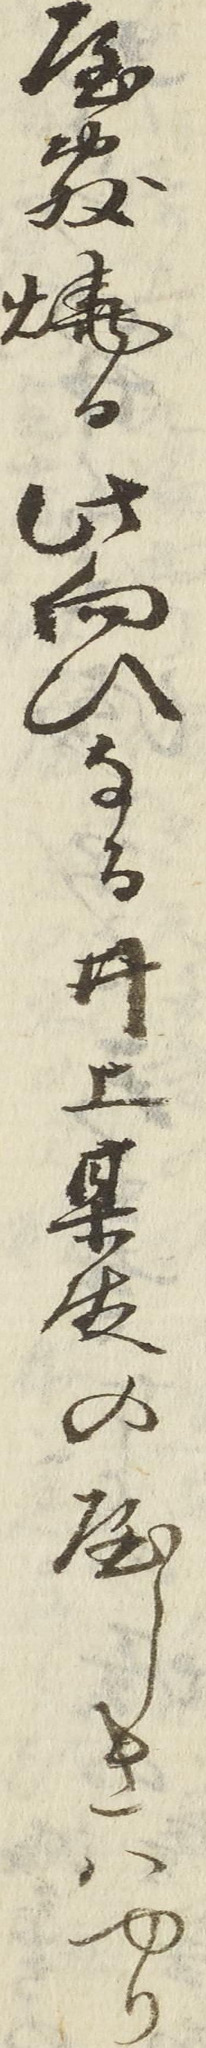屋敷焼る此向ひなる井上某殿の屋しきはゆり
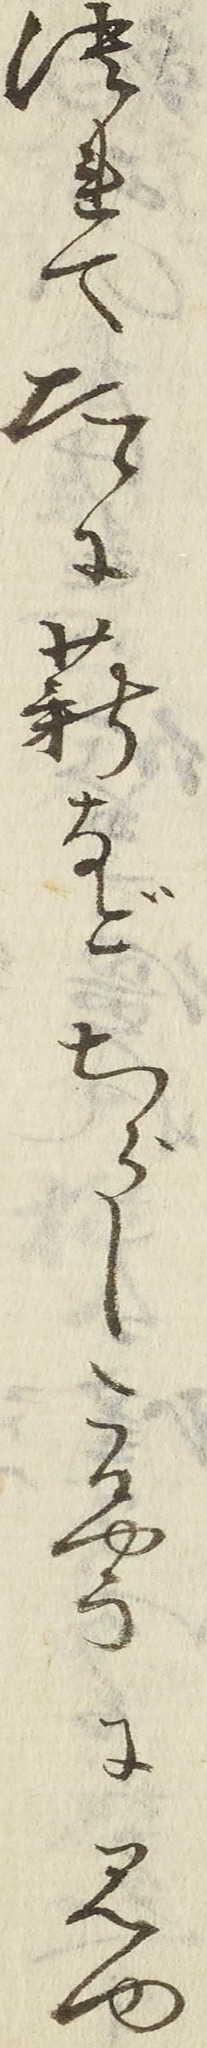潰れてたゝに薪などちらしたるやうに見ゆ
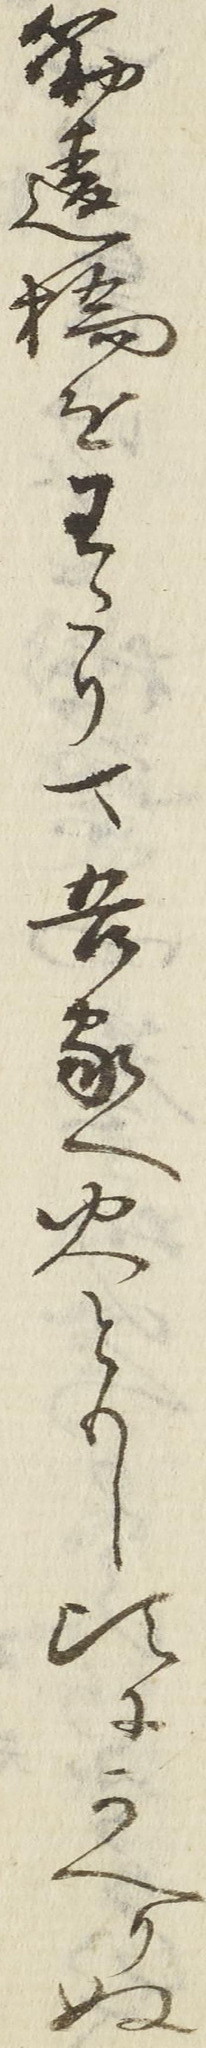筋違橋をわたりて吾家へ火ともし頃にかへりぬ
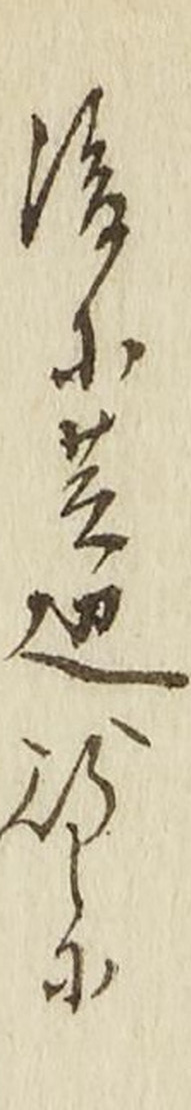後に芝辺へ行しに
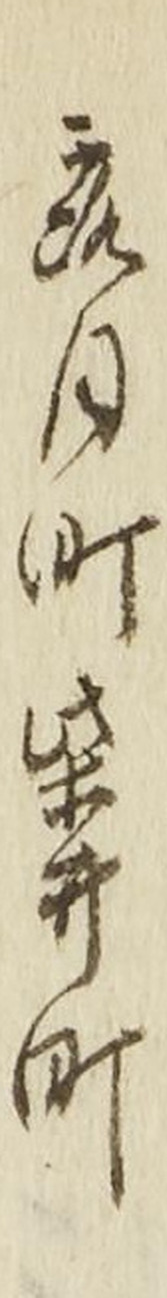露月町芝井町
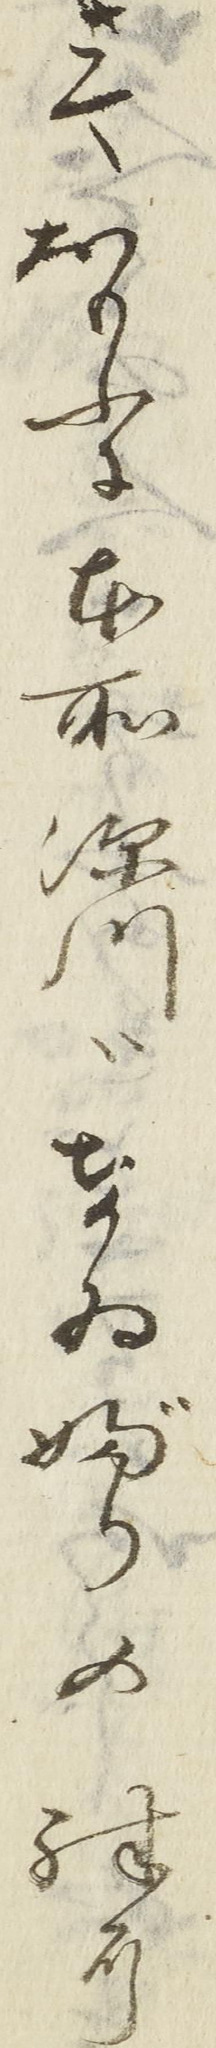さておもふに本所深川はなゐぶりの殊に
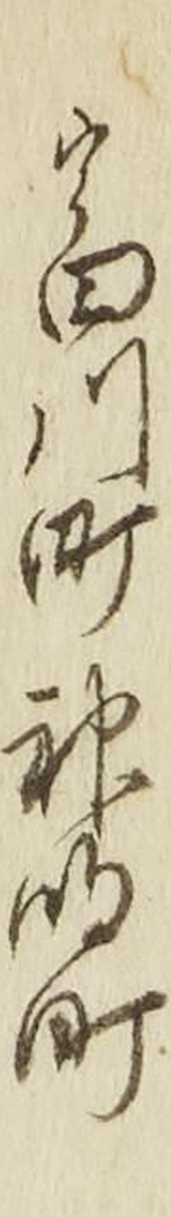宇田川町神明町
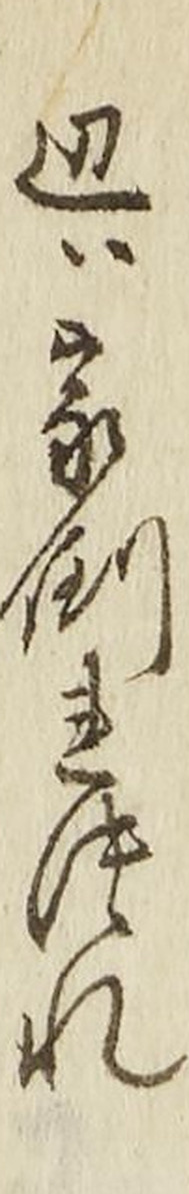辺は家倒れ潰れ
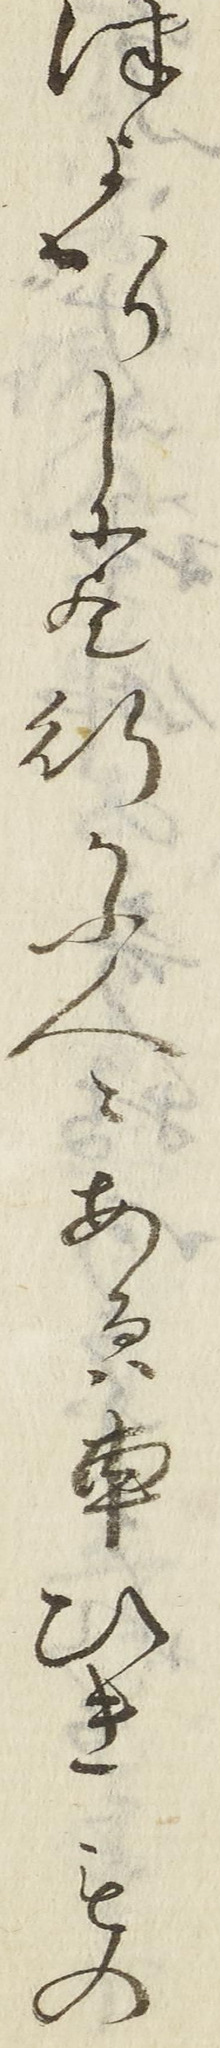つよかりしに歟行かふ人〻あるは車ひきもの
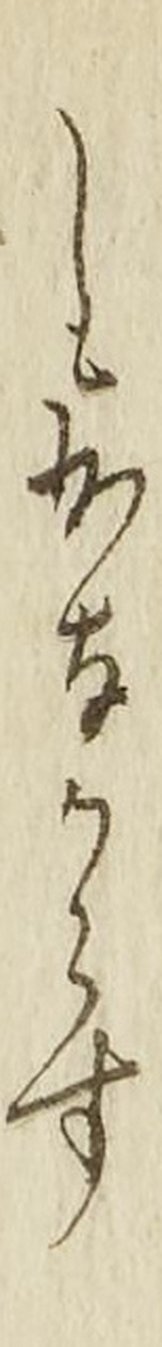しも少なからす
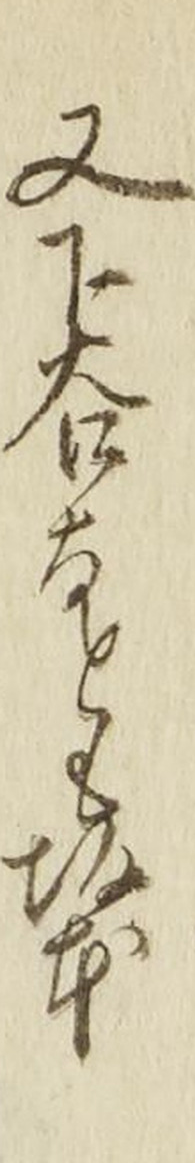又下谷なとも坂本
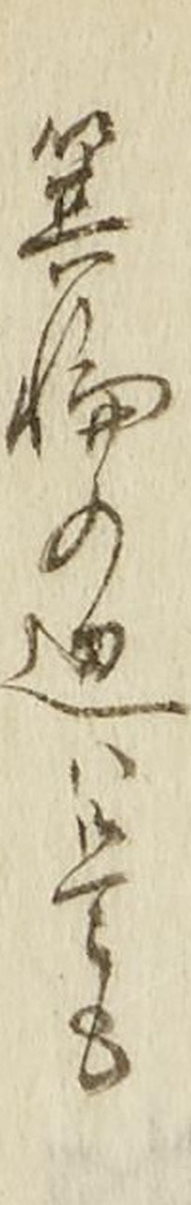箕輪の辺は是も
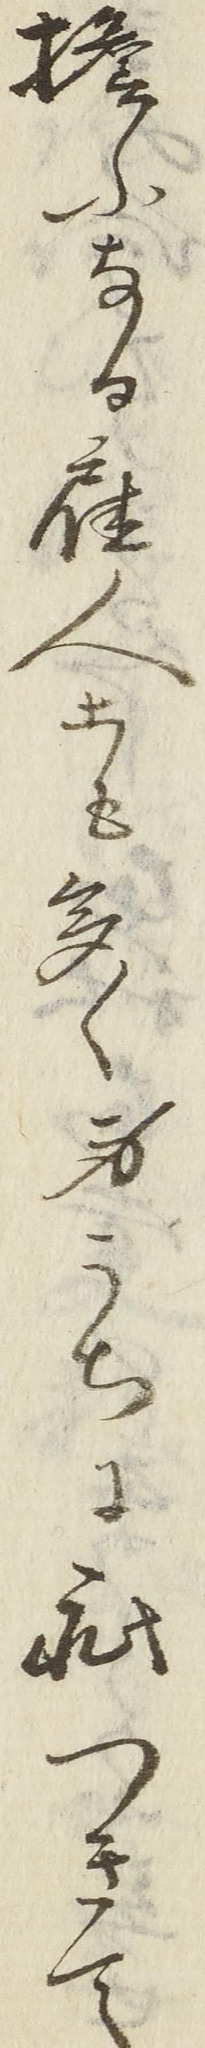擔ふなる雇人等も多く身うちに疵つきて
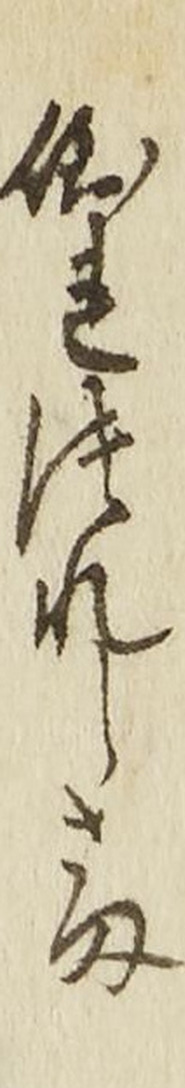倒れ潰れしさま
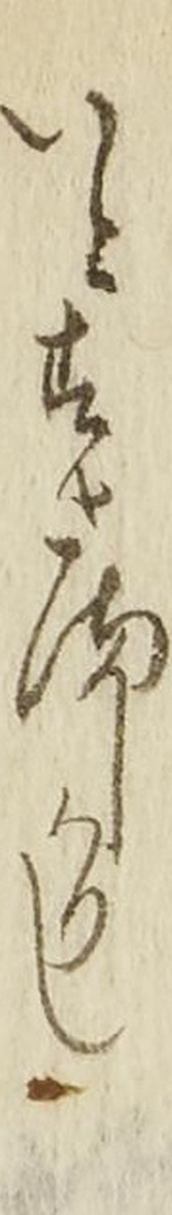いとすさましかりし
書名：やぶれ窓の記　全
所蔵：東京大学地震研究所図書室 Earthquake Research Institute Library, The University of Tokyo, JAPAN
